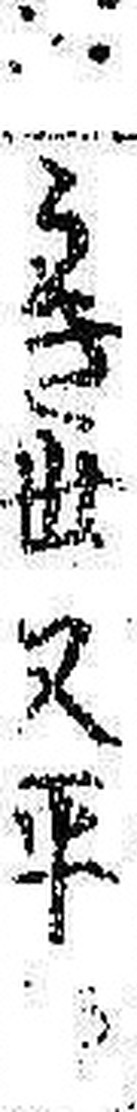うき世又平

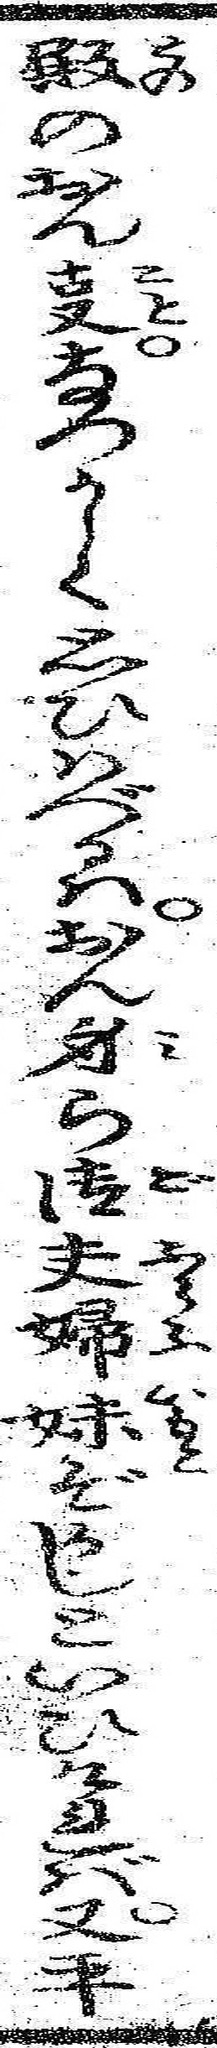殿のおん事。なつかしく思ひはべるは。おん身ら御夫婦妹ぞかしといひければ。又平
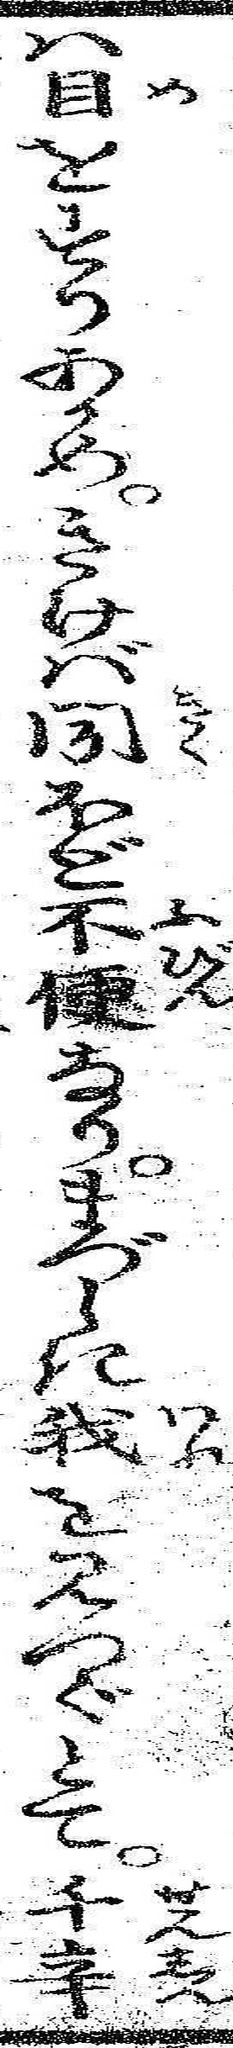は目をすりあかめ。きけば聞ほど不便なり。まづしき我を見つぐとて。千辛
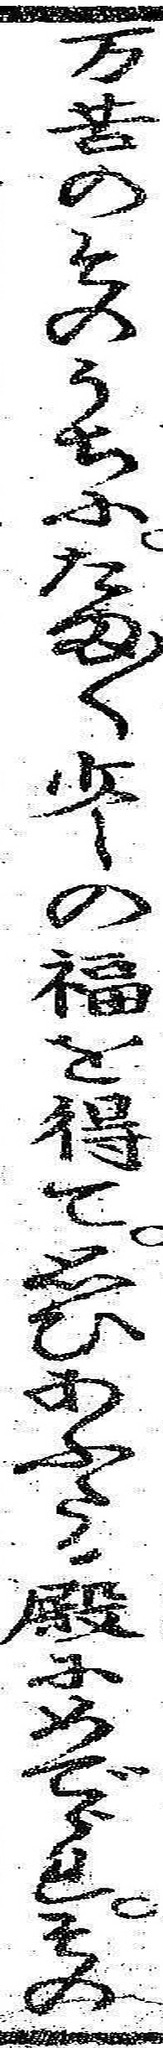万苦のそのうちに。たま〳〵少しの福を得て。思ひあふたる殿にめでられ。その
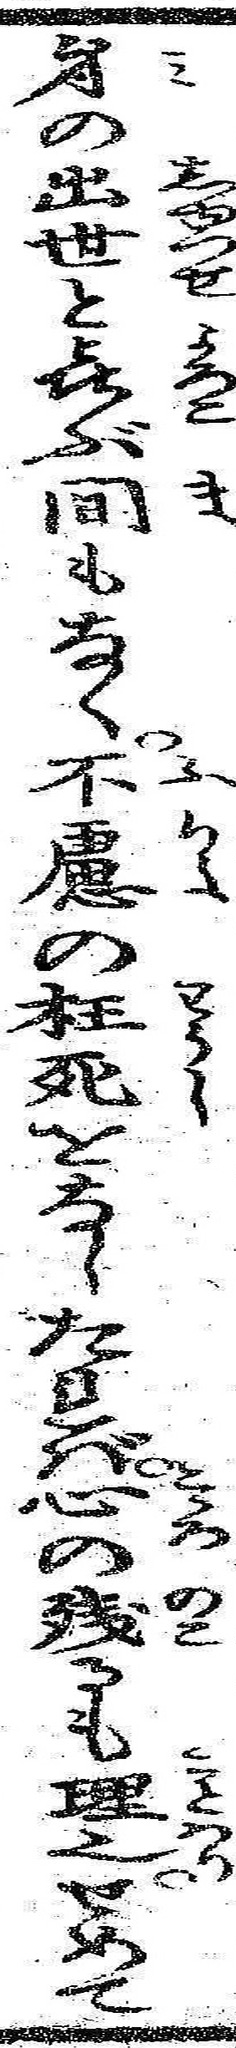身の出世と喜ぶ間もなく。不慮の枉死をなしたれば。心の残るも理也。せめて
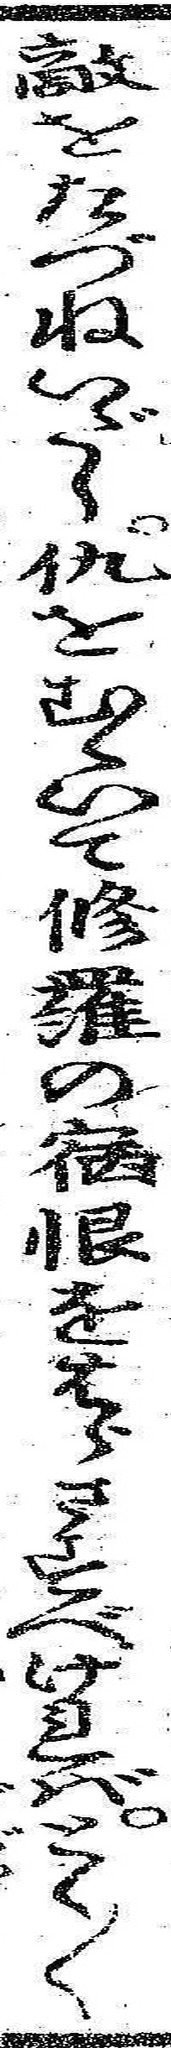敵をたづねいだし。仇をむくいて修羅の宿恨をはらさすべければ。とく〳〵
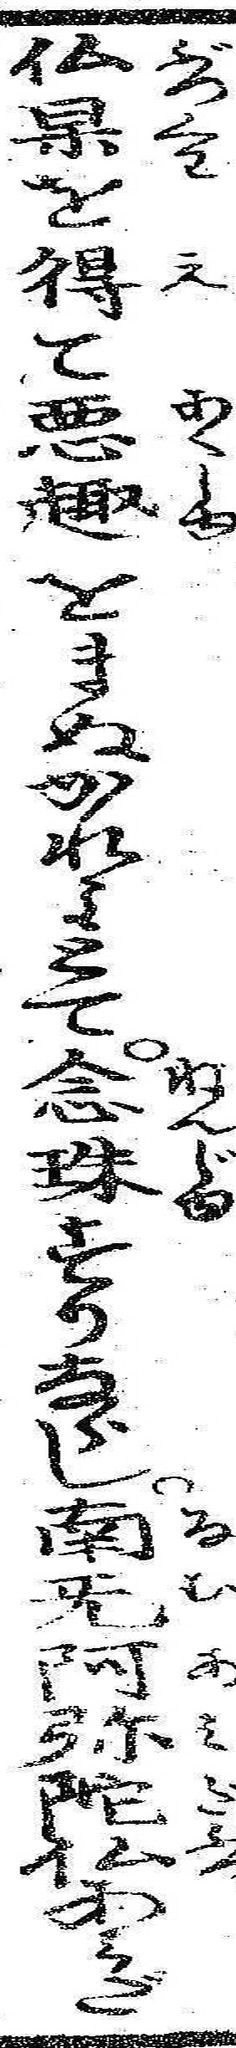仏果を得て悪趣をまぬかれよとて。念珠すりならし。南無阿弥陀仏あみだ
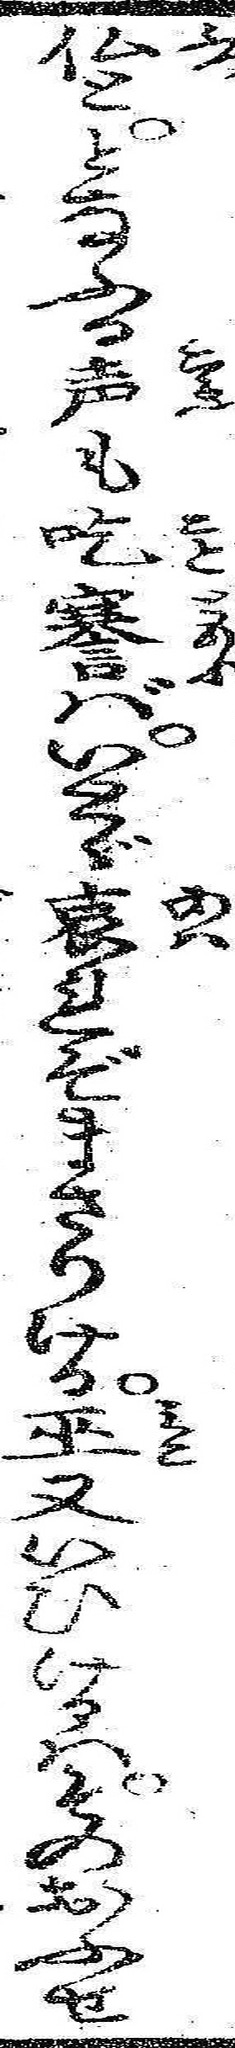仏と。となふる声も吃謇ば。いとゞ哀れぞまさりける。巫又いひけるは。そのおふせ
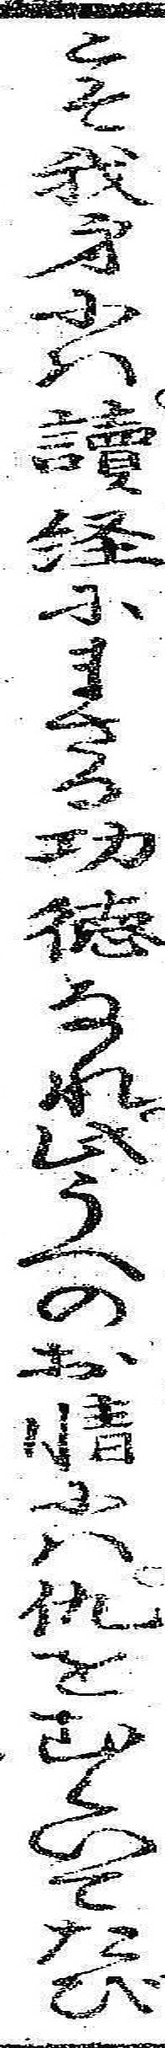こそ我身には。読経にまさる功徳なれ。此うへのお情には。仇をむくいてたび
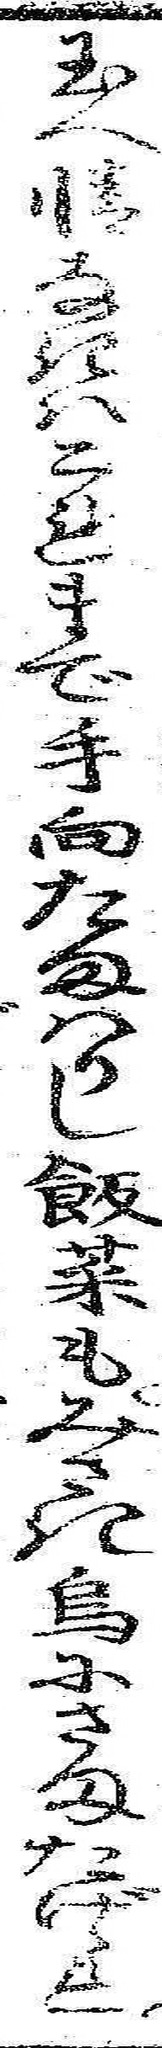玉へ。情なきはこれまで手向たまはりし飯菜も。みさき烏にさまたげられ。
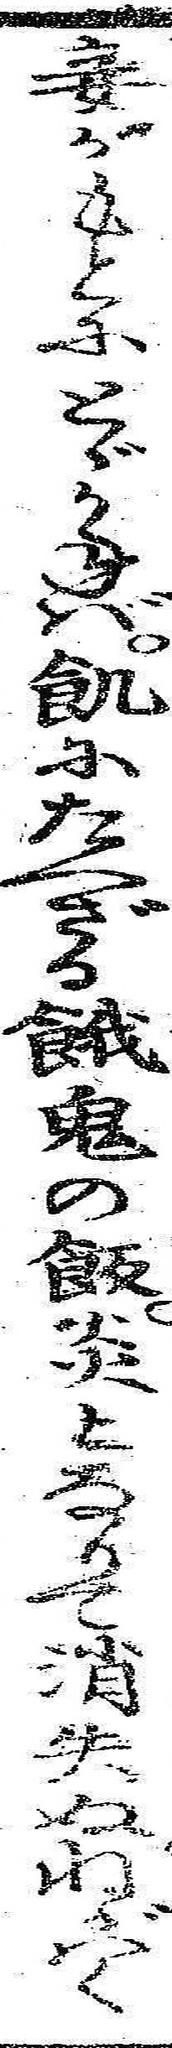妾がもとにとゞかねば。飢にたへざる餓鬼の飯。炎となりて消失ぬ。ねがはく
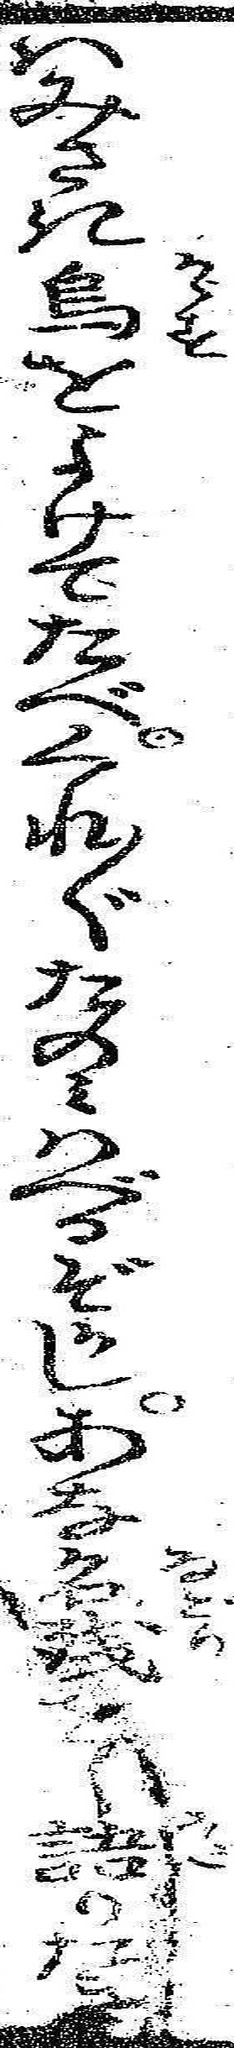はみさき烏をよけてたべ。くれ〴〵たのみはべるぞかし。あな名残をし語りたき
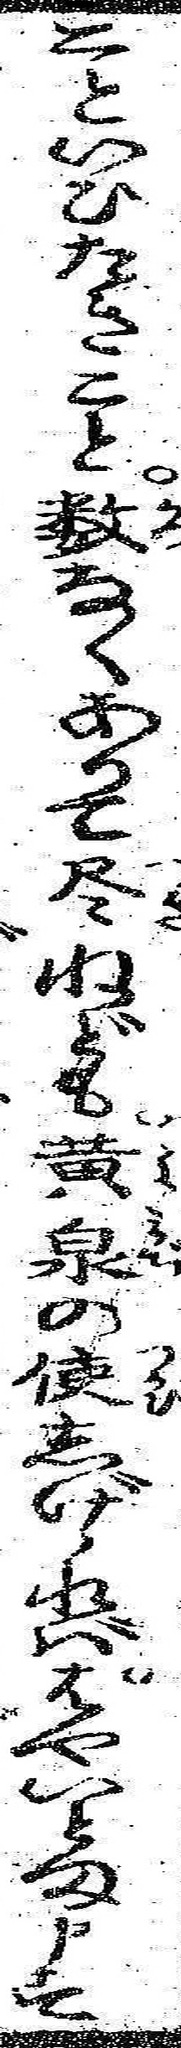こといひたきこと。数なくありて尽ねども。黄泉の使しげゝれば。はやいとま申す
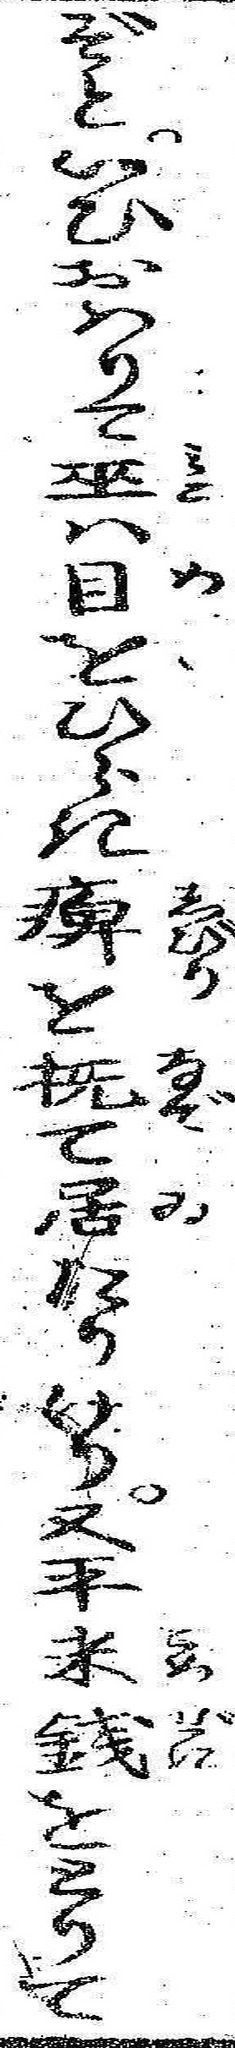ぞと。いひおはりて巫は目をひらき痺を撫て居たりけり。又平米銭をとりて
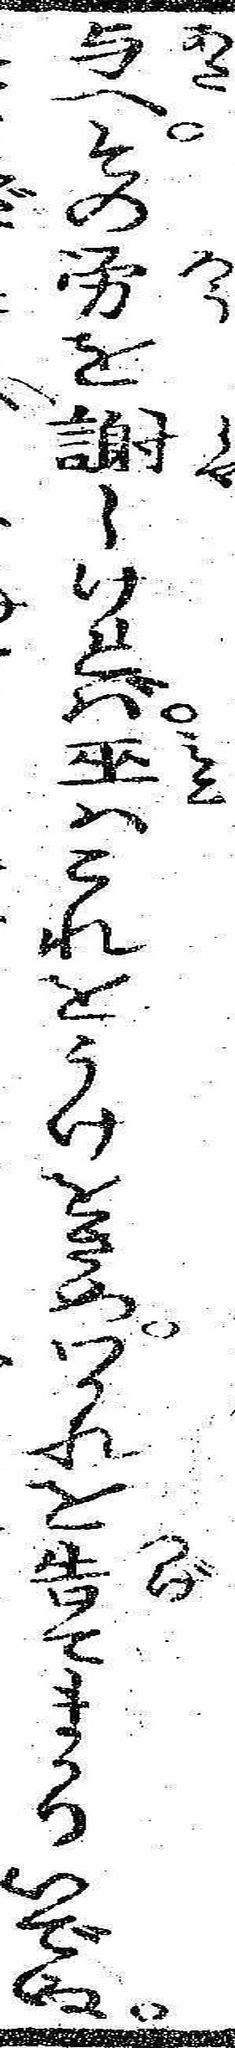与へ。その労を謝しければ。巫はこれをうけをさめ。わかれを告てまかりいでぬ。
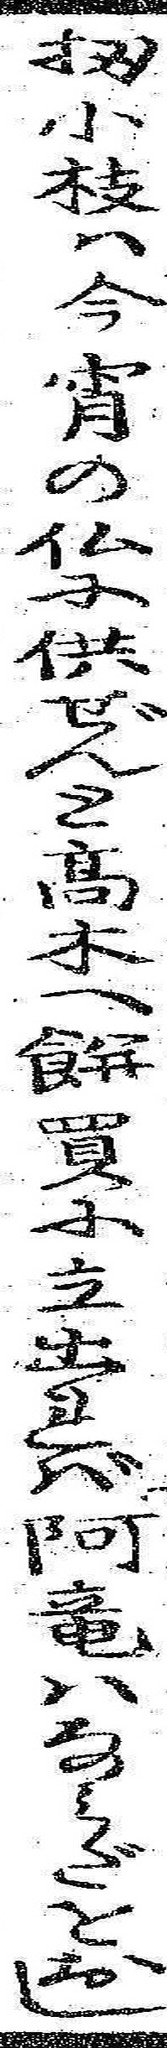扨小枝は。今宵の仏に供ぜんと高木へ餅買に立出れば。阿竜はなみだをおし。
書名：昔話稲妻表紙
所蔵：国文学研究資料館
